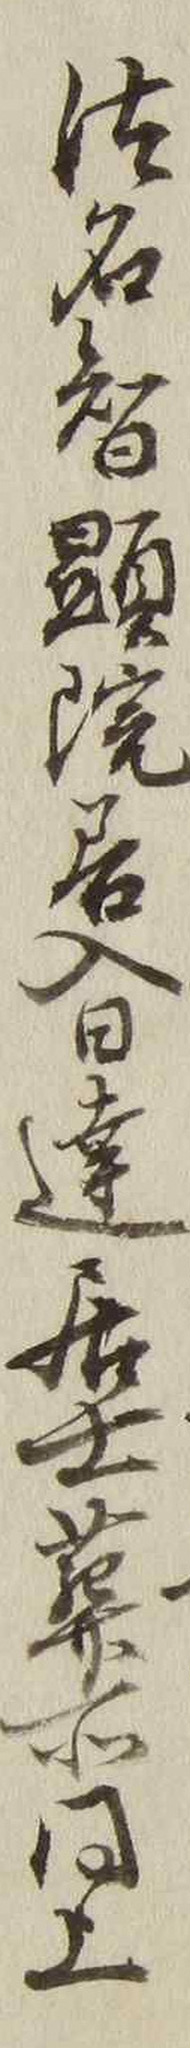法名智顕院善入日達居士葬所同上

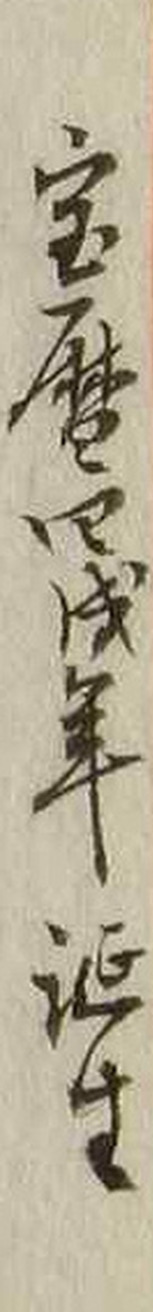宝暦四戌年誕生
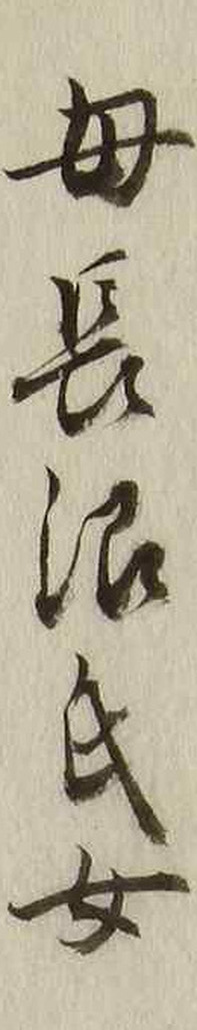母長浪氏女
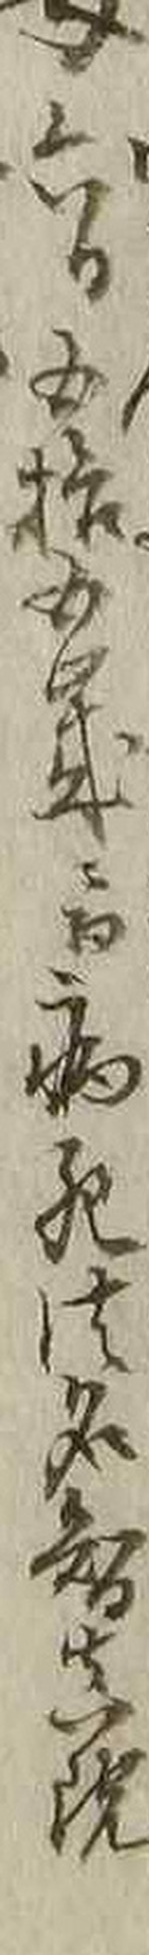六日五拾五歳ニ而病死法名智真院
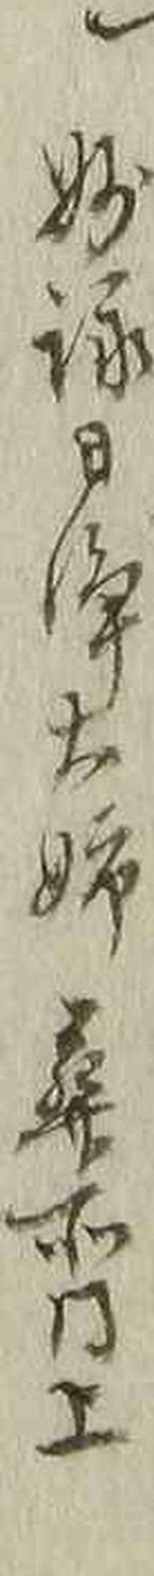妙詠日浄大姉葬所同上
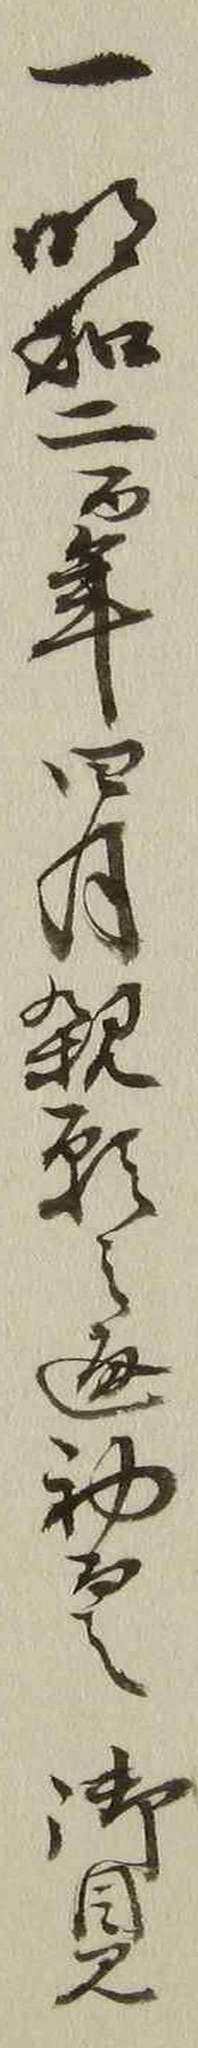一明和二酉年四月親願之通初而之御目見
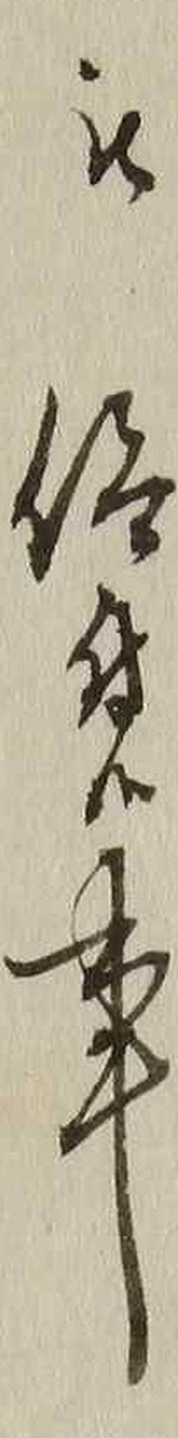被仰付候事
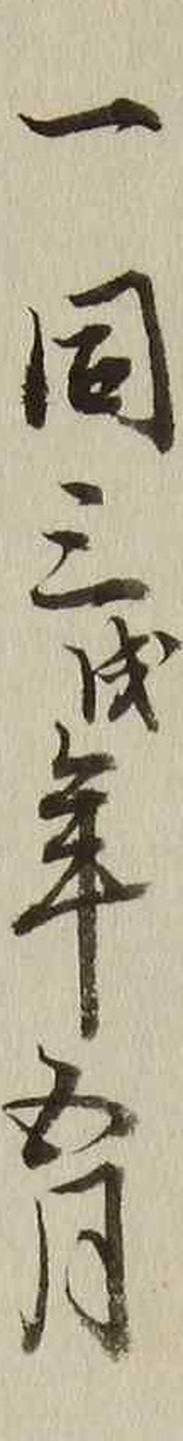一同三戌年五月
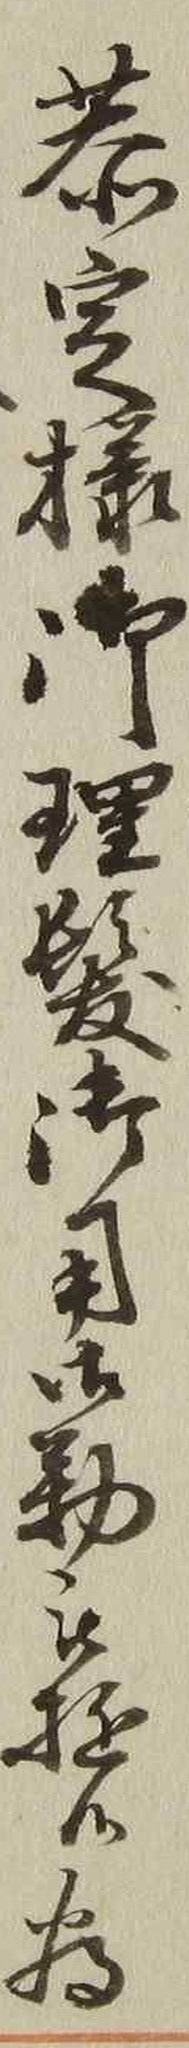恭定様御理髪御用御勤被遊候為
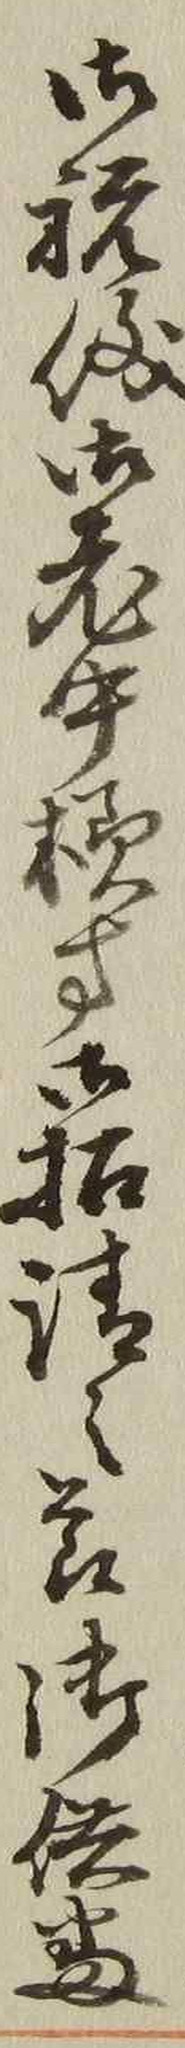御祝儀御老中様方御招請之節御供番
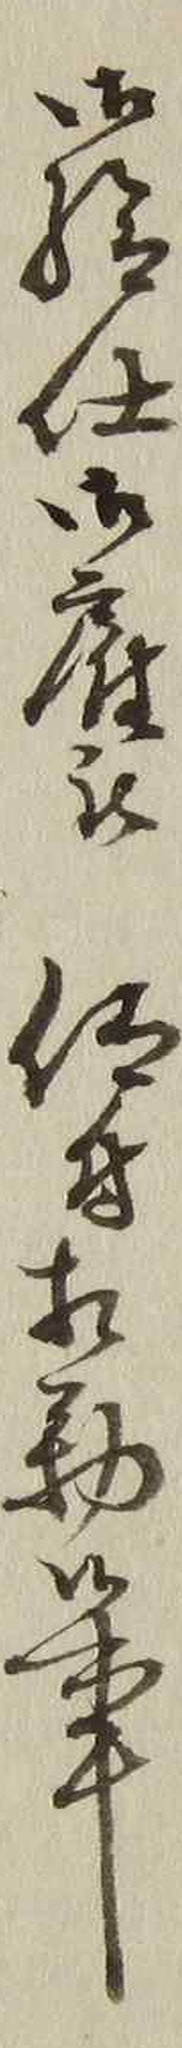御給仕御雇被仰付相勤候事
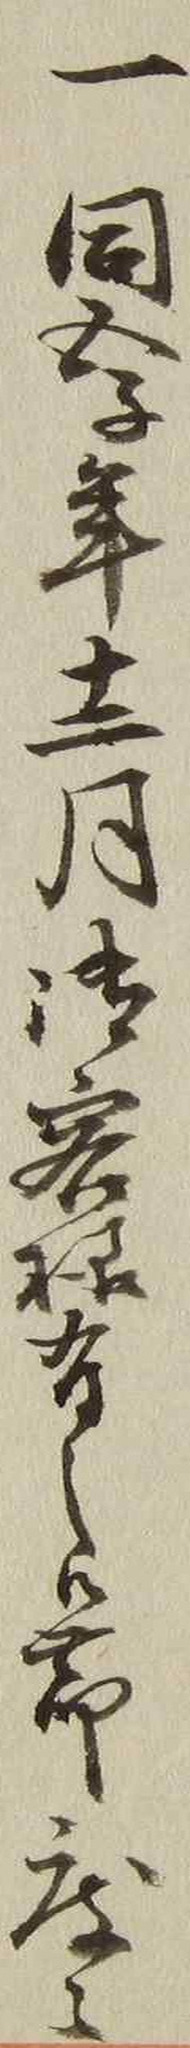一同五子年十二月御客様有之候節度々
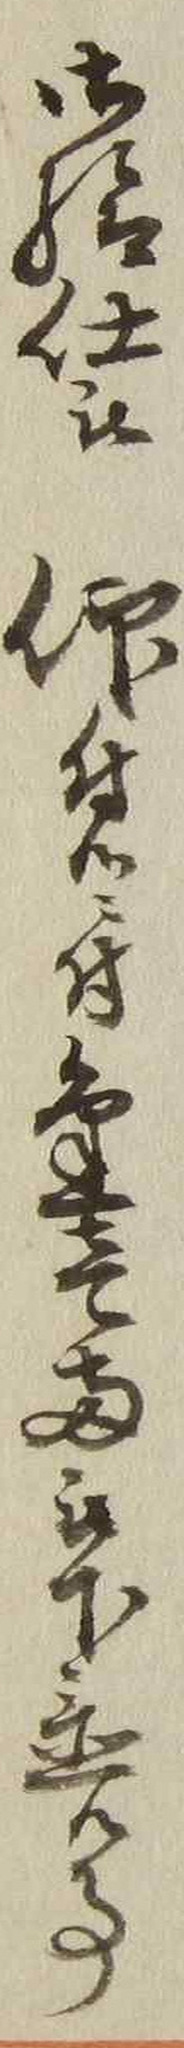御給仕被仰付候ニ付金壱両被下置候事
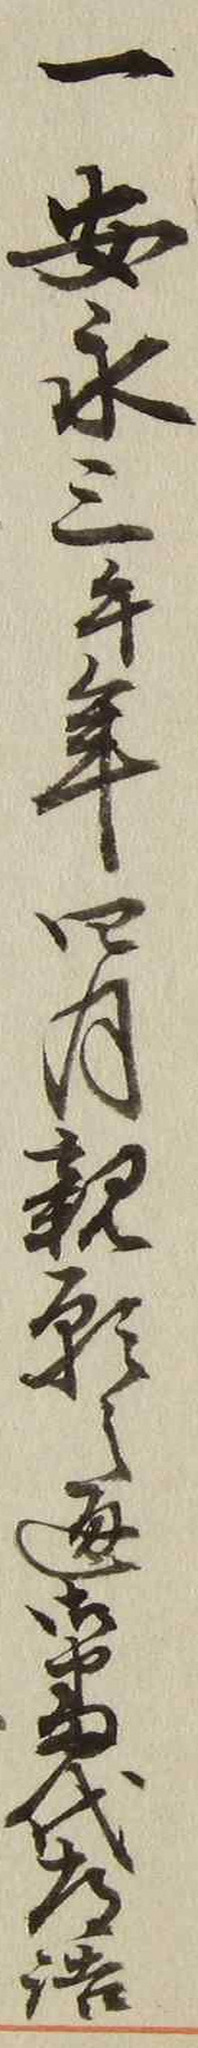一安永三午年四月親願之通御番代常詰
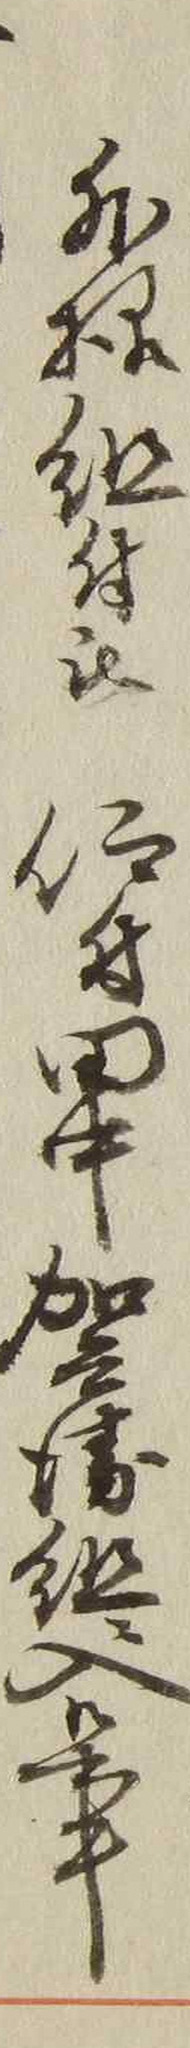外様組付被仰付田中加兵衛組ニ入候事
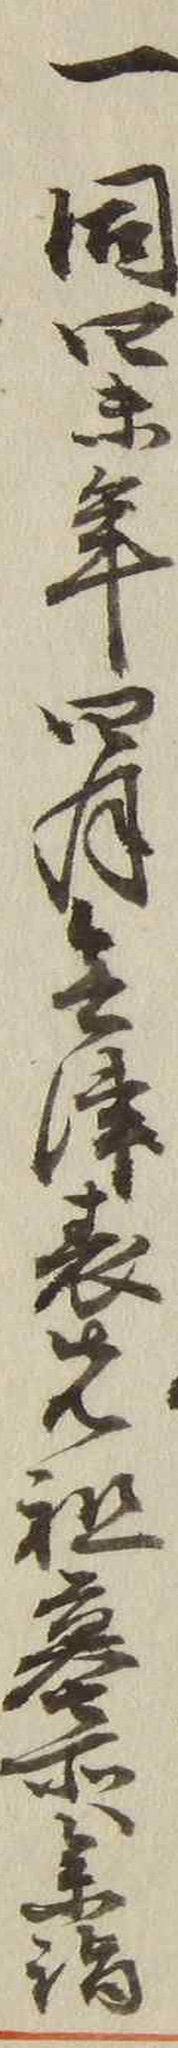一同四未年四月会津表先祖墓所へ参詣
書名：諸士系譜　巻之23　い之部23
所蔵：会津若松市立会津図書館
